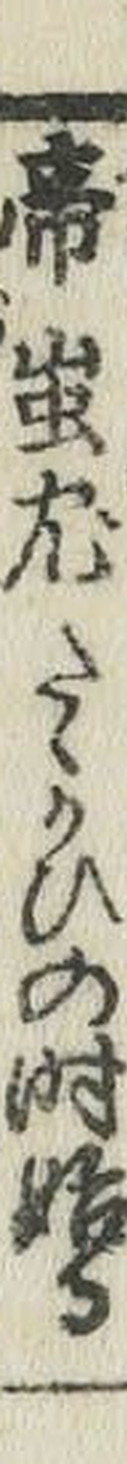帝蚩尤たゝかひの時始る
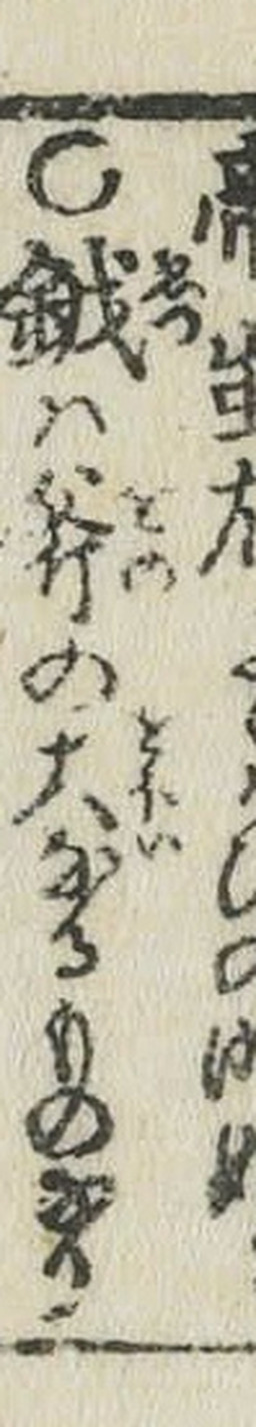○鉞は斧の大なるものなり
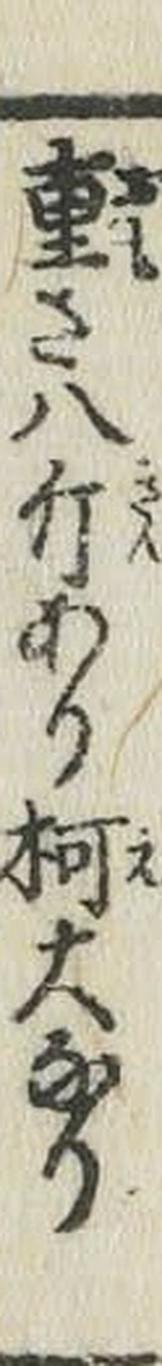重さ八斤あり柯大なり
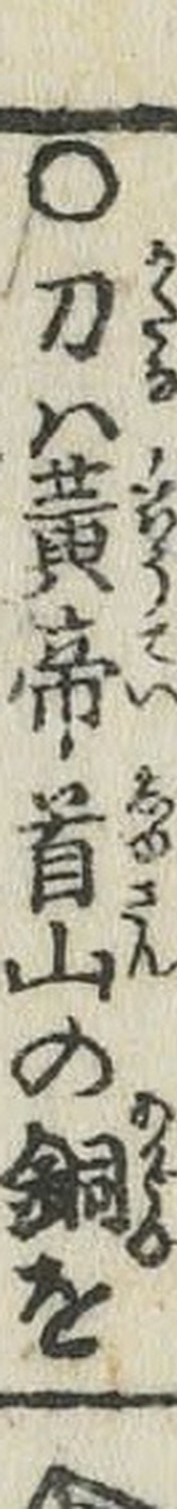○刀は黄帝首山の銅を
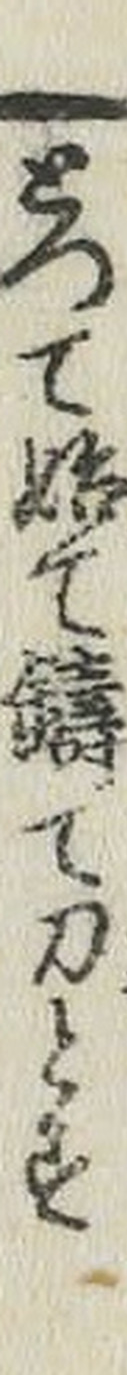とつて始て鋳て刀とす
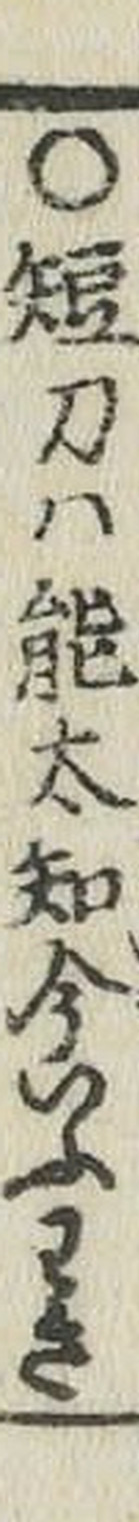○短刀は能太知今いふわき
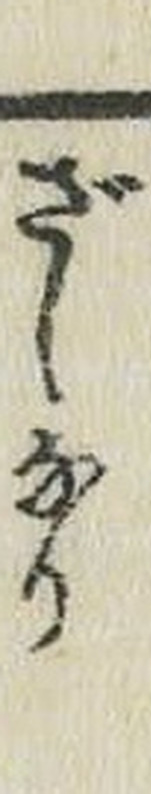ざしなり
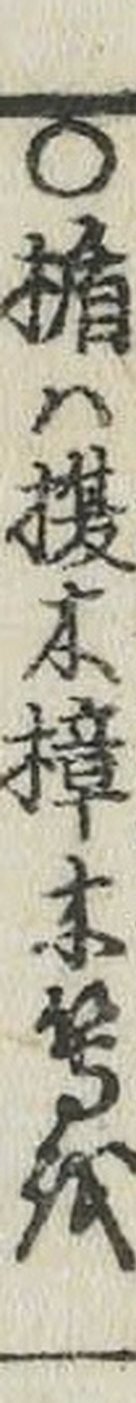○楯は榎木樟木等を
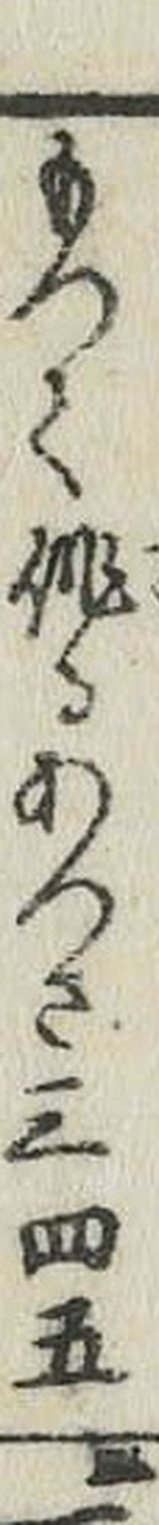もつて作るあつさ三四五
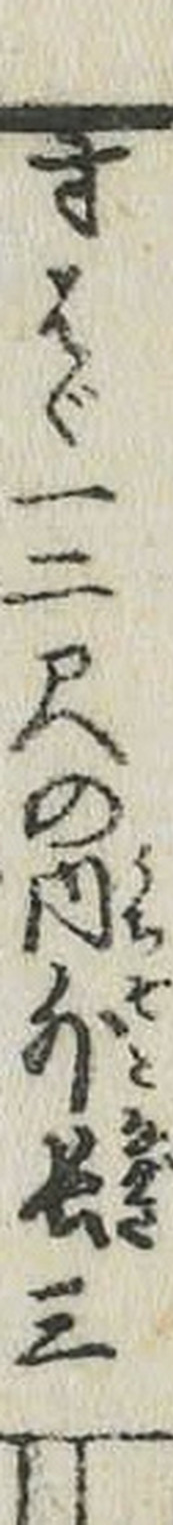寸はゞ一二尺の内外長三
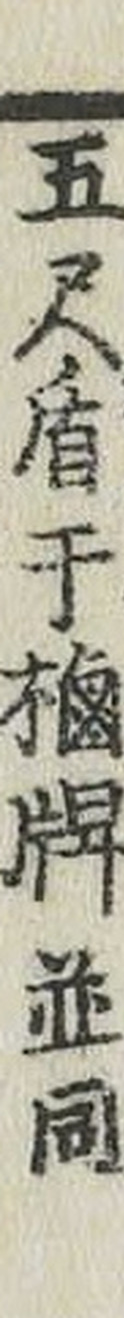五尺盾干樐牌並同
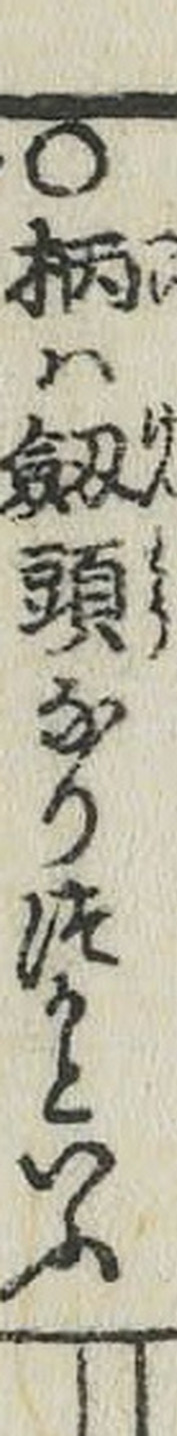○柄は剣頭なりつかといふ
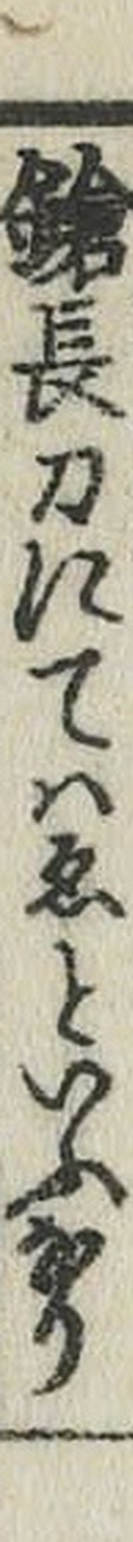鎗長刀にてはゑといふなり

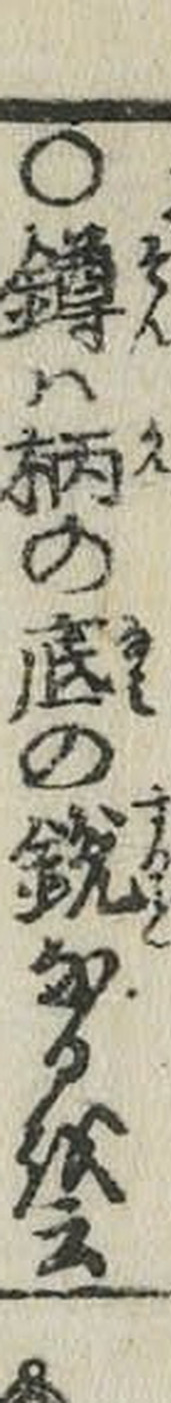○鐏は柄の底の鋭なるを云
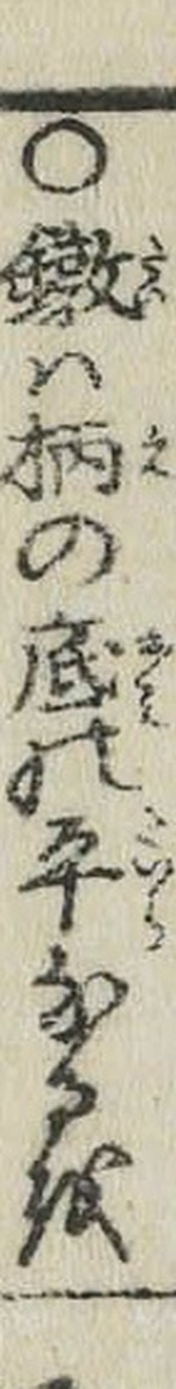○鐓は柄の底の平なるを
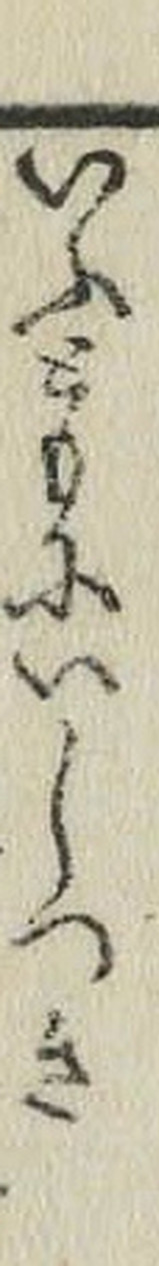いふともにいしつき
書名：増補頭書訓蒙図彙大成 10巻 5:巻之9-11
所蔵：東京学芸大学教育コンテンツアーカイブ
